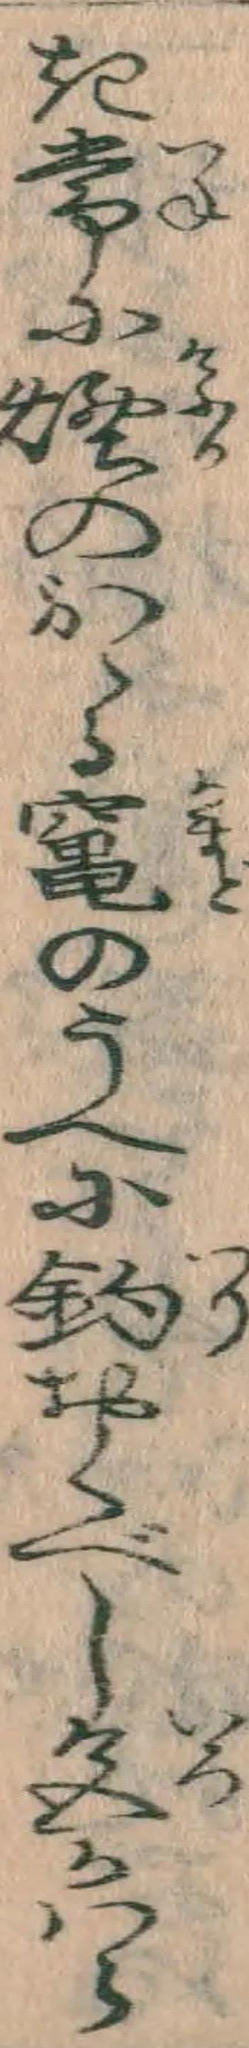き常に煙のかゝる竈のうへに釣おくべし色かはら
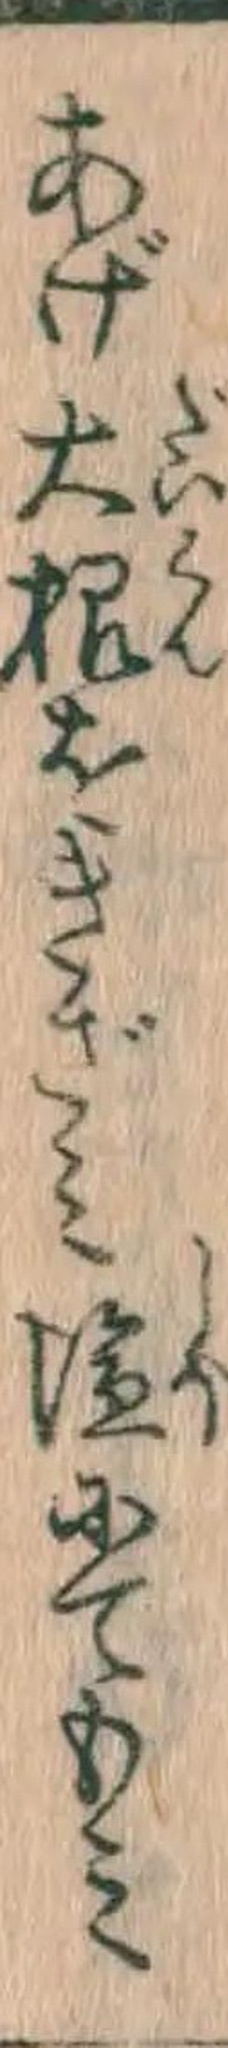あげ大根をきざみ塩にてもみ
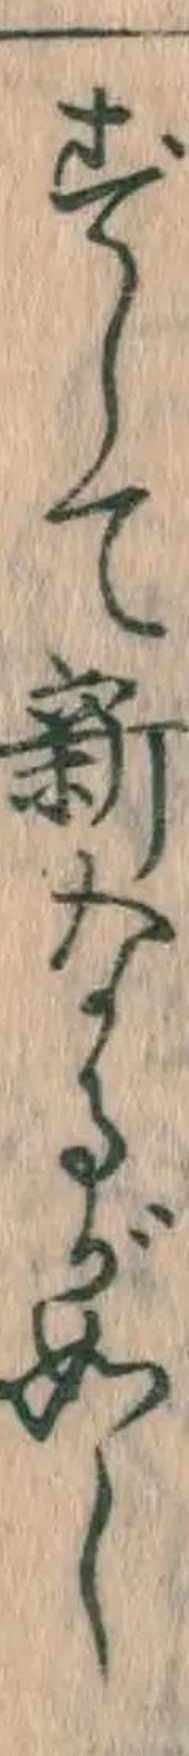ずして新なるが如し
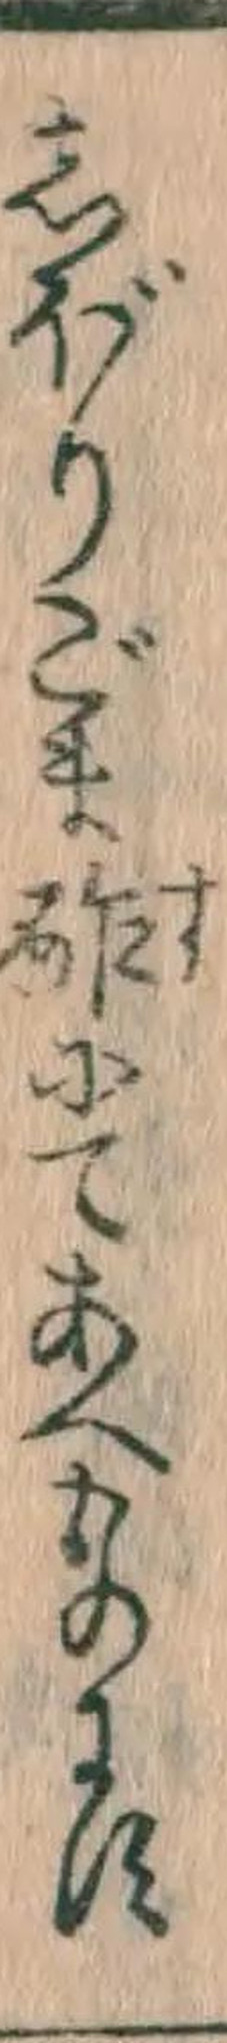しぼりごま酢にてあへものにす
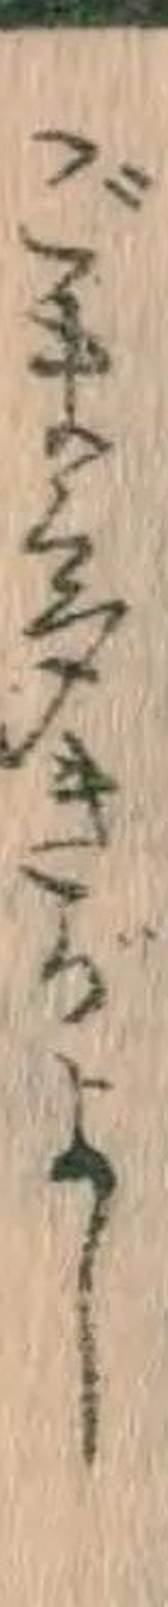ごま多きがよし
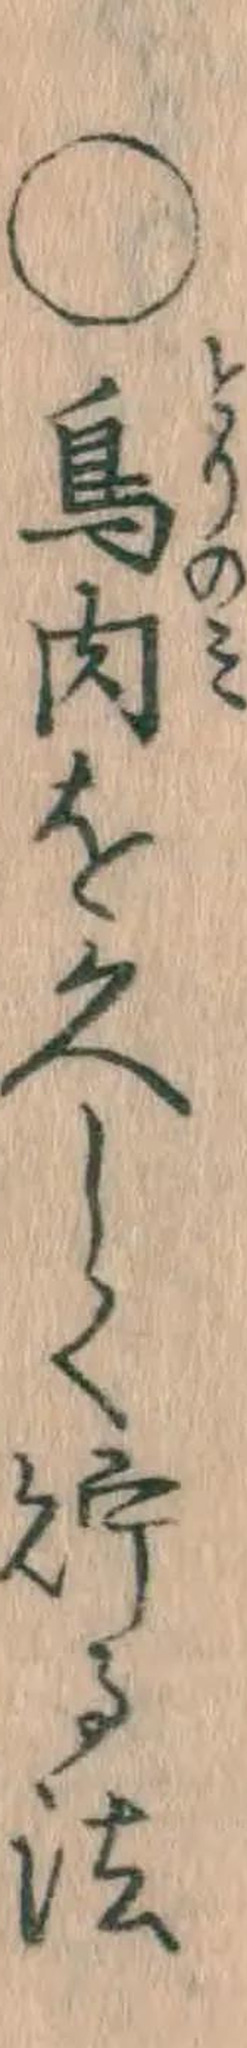○鳥肉を久しく貯る法
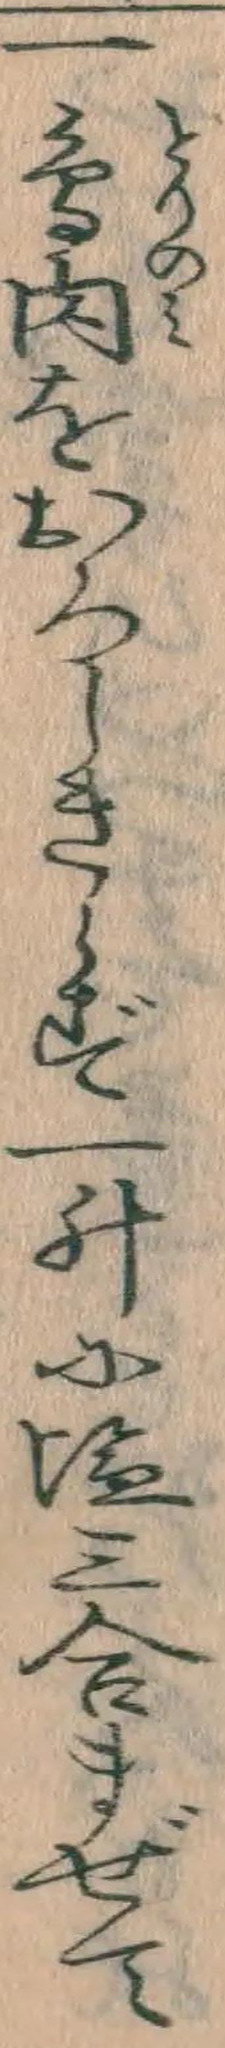一鳥肉をおろしきらず一升に塩三合まぜて
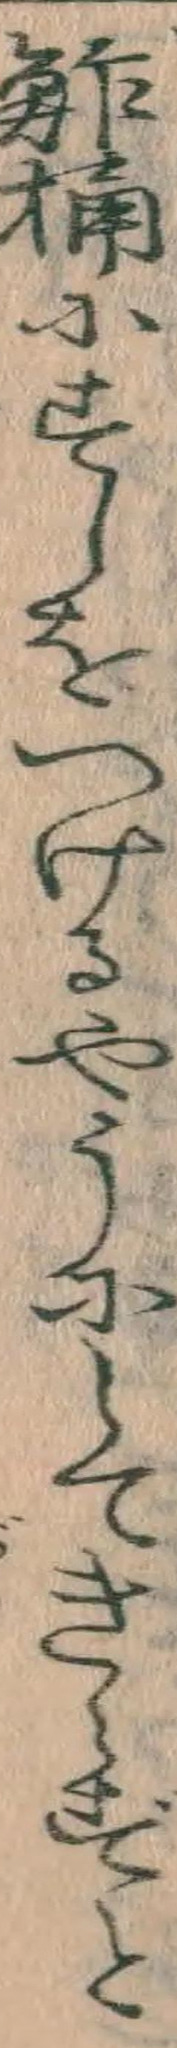鮓桶にすしをつけるやうにしてきらずと
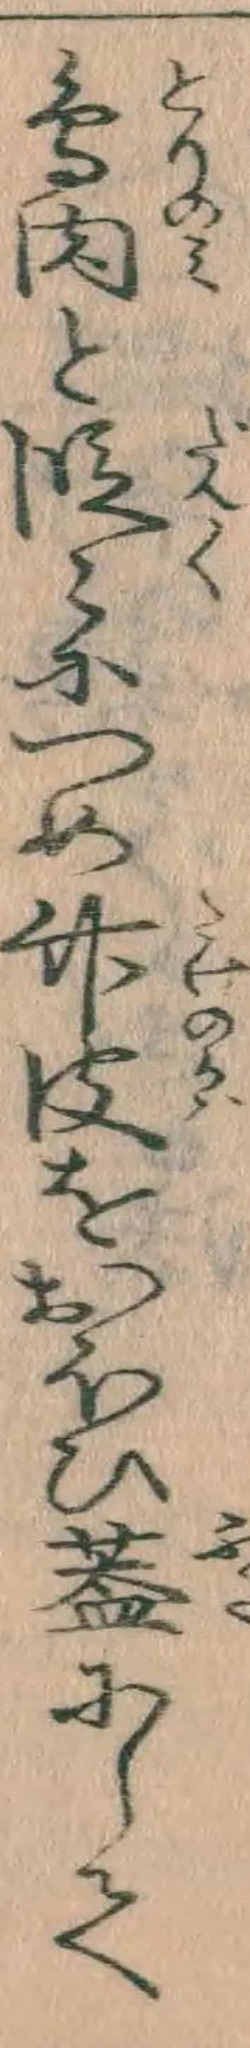鳥肉と段々につめ竹皮をおほひ蓋にして
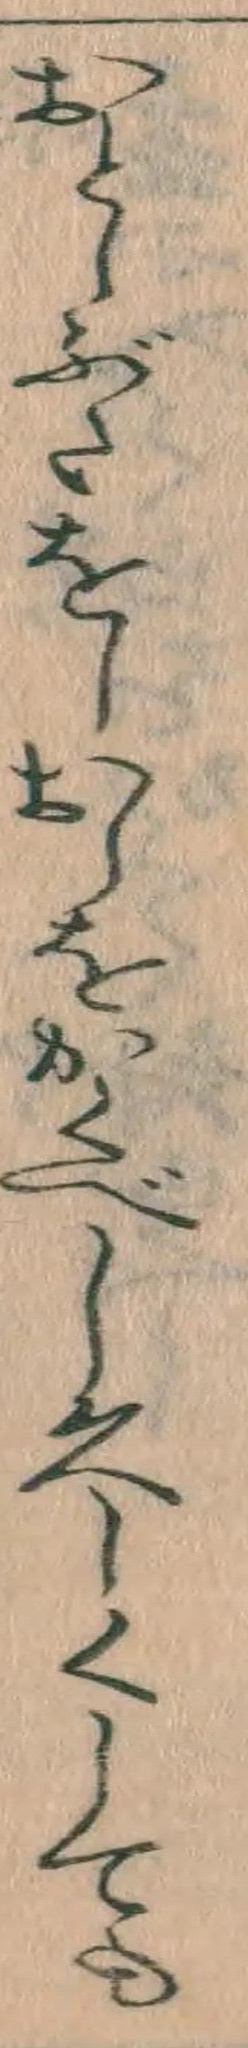おとしぶたをしおしをかくべし久しくしても
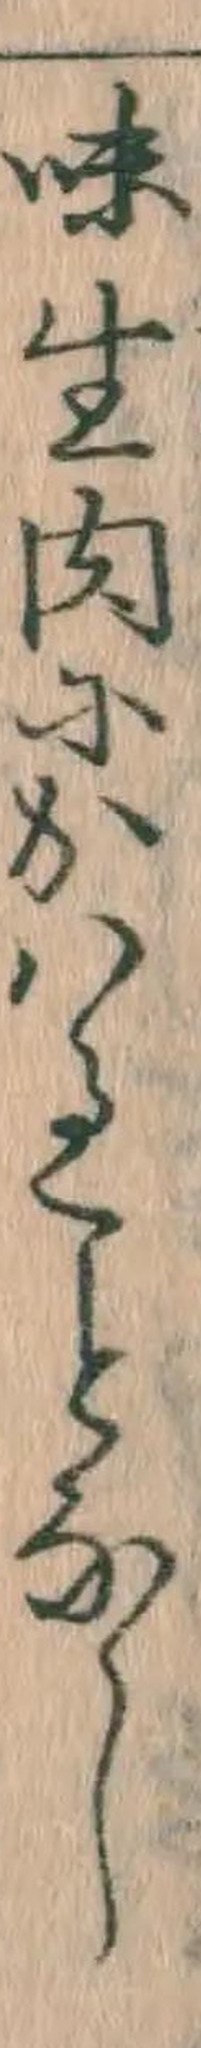味生肉にかはることなし
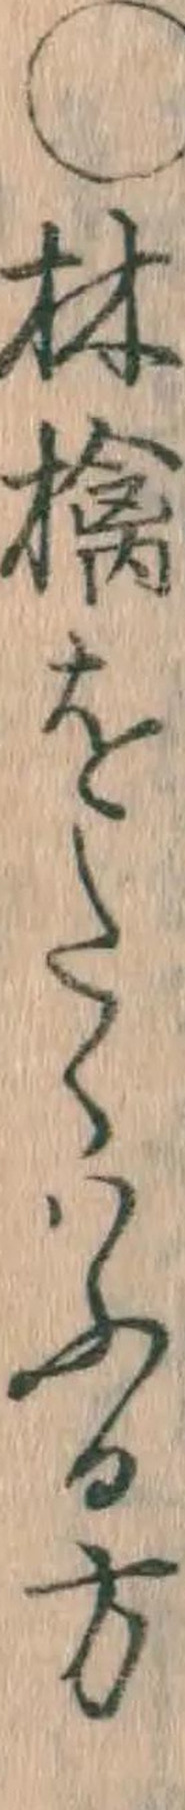○林檎をたくはふる方
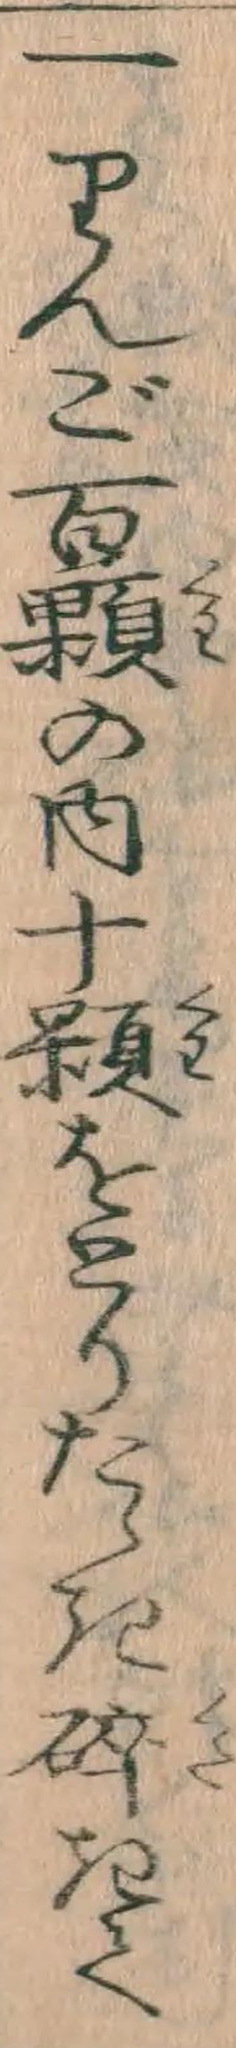一りんご百顆の内十顆をとりたゝき砕きて
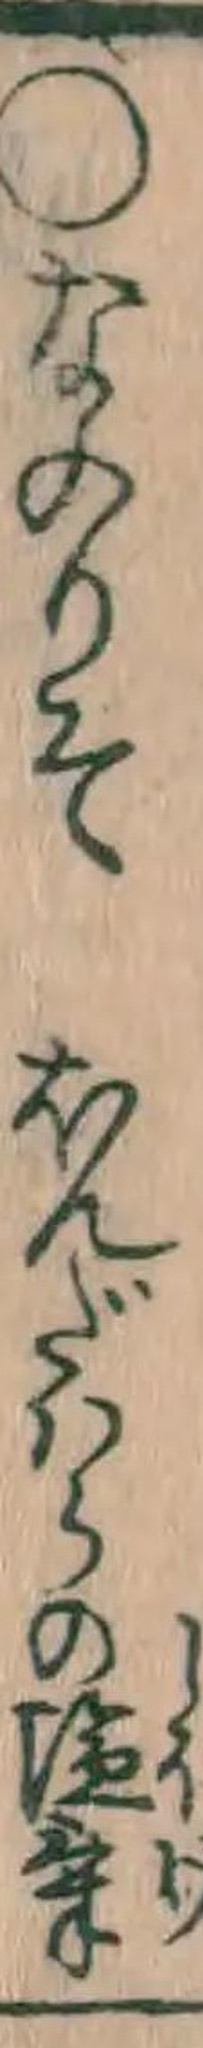○なのりそほんだはらの塩気
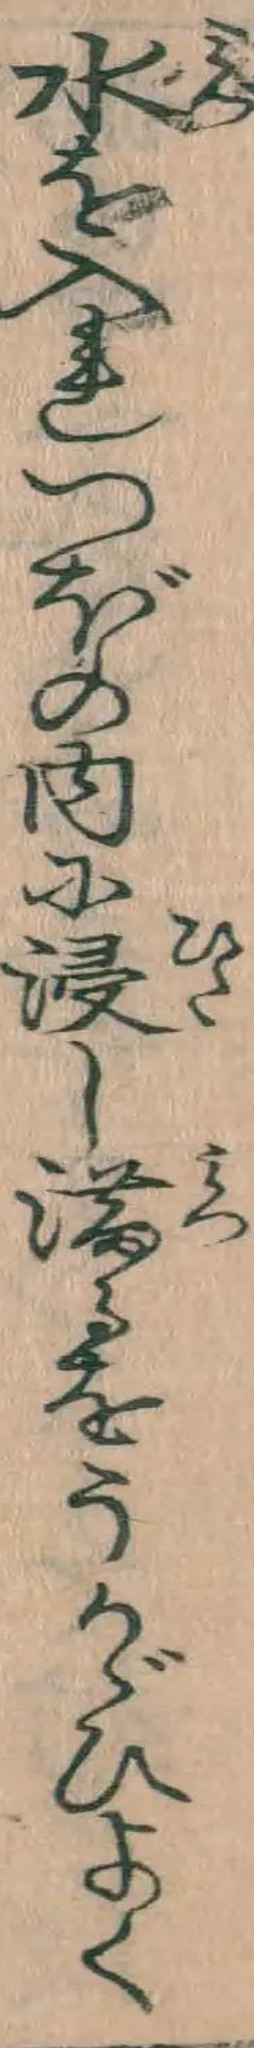水を入れつぼの内に浸し満るをうかゞひよく
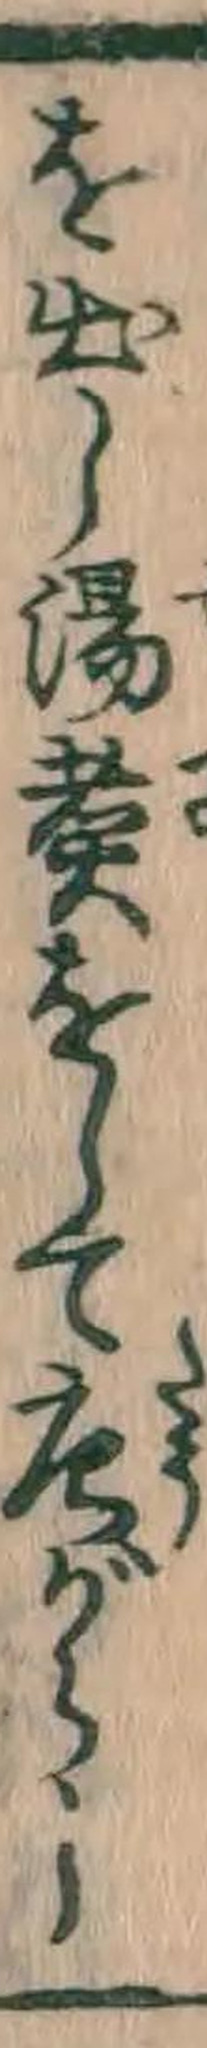を出し湯煮をして唐がらし
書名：広益秘事大全 3巻. [5]
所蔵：国立国会図書館 National Diet Library, JAPAN
